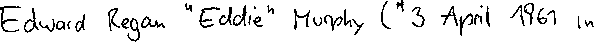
Edward Regan "Eddie" Murphy (* 3. April 1961 in
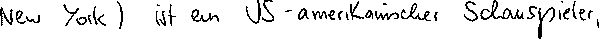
New York) ist ein US-amerikanischer Schauspieler,
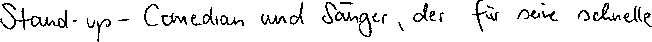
Stand-up-Comedian und Sänger, der für seine schnelle
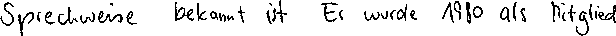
Sprechweise bekannt ist. Er wurde 1980 als Mitglied
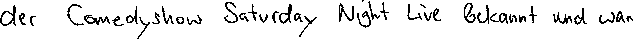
der Comedyshow Saturday Night Live bekannt und war
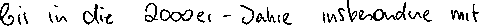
bis in die 2000er-Jahre insbesondere mit
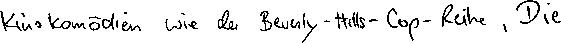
Kinokomödien wie der Beverly- Hills-Cop-Reihe, Die
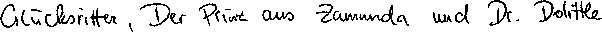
Glücksritter, Der Prinz aus Zamunda und Dr. Dolittle
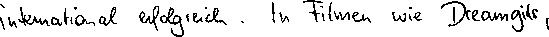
international erfolgreich. In Filmen wie Dreamgirls,
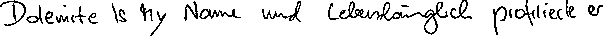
Dolemite Is My Name und Lebenslänglich profilierte er
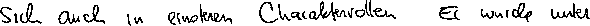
sich auch in ernsteren Charakterrollen. Er wurde unter
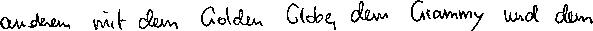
anderem mit dem Golden Globe, dem Grammy und dem
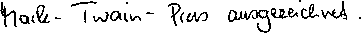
Mark-Twain-Preis ausgezeichnet.
